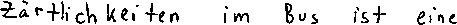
Zärtlichkeiten im Bus ist eine
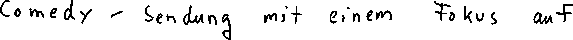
Comedy-Sendung mit einem Fokus auf
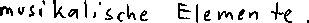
musikalische Elemente.
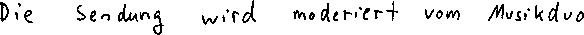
Die Sendung wird moderiert vom Musikduo
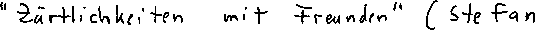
"Zärtlichkeiten mit Freunden" (Stefan
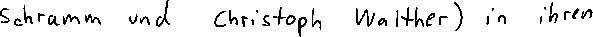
Schramm und Christoph Walther) in ihren
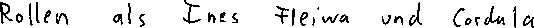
Rollen als Ines Fleiwa und Cordula
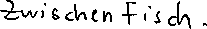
Zwischenfisch.
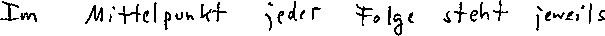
Im Mittelpunkt jeder Folge steht jeweils
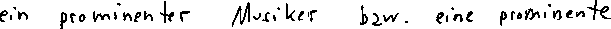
ein prominenter Musiker bzw. eine prominente
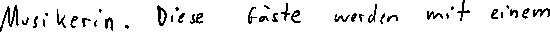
Musikerin. Diese Gäste werden mit einem
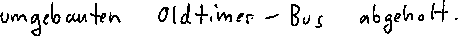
umgebauten Oldtimer-Bus abgeholt.
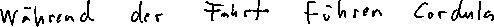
Während der Fahrt führen Cordula
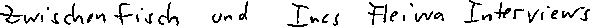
Zwischenfisch und Ines Fleiwa Interviews
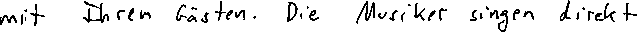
mit ihren Gästen. Die Musiker singen direkt
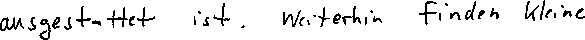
ausgestattet ist. Weiterhin finden kleine
